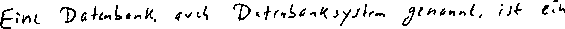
Eine Datenbank, auch Datenbanksystem genannt, ist ein
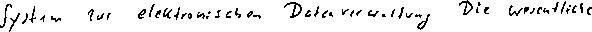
System zur elektronischen Datenverwaltung. Die wesentliche
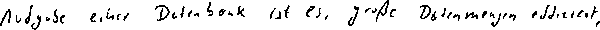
Aufgabe einer Datenbank ist es, große Datenmengen effizient,
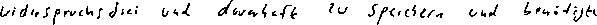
widerspruchsfrei und dauerhaft zu speichern und benötigte
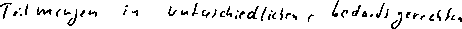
Teilmengen in unterschiedlichen, bedarfsgerechten
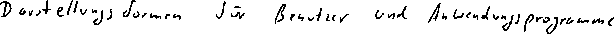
Darstellungsformen für Benutzer und Anwendungsprogramme
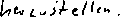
bereitzustellen.
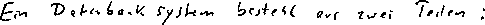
Ein Datenbanksystem besteht aus zwei Teilen:
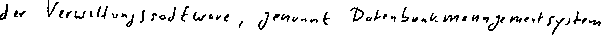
der Verwaltungssoftware, genannt Datenbankmanagementsystem
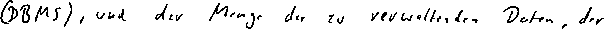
(DBMS), und der Menge der zu verwaltenden Daten, der
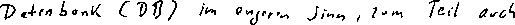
Datenbank (DB) im engeren Sinn, zum Teil auch
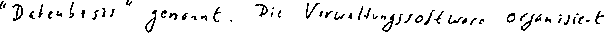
"Datenbasis" genannt. Die Verwaltungssoftware organisiert
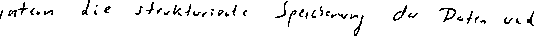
intern die strukturierte Speicherung der Daten und
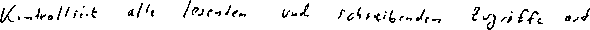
kontrolliert alle lesenden und schreibenden Zugriffe auf
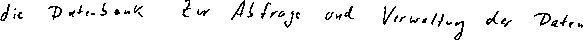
die Datenbank. Zur Abfrage und Verwaltung der Daten
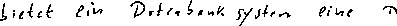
bietet ein Datenbanksystem eine
